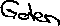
Goten
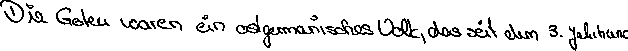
Die Goten waren ein ostgermanisches Volk, das seit dem 3. Jahrhund
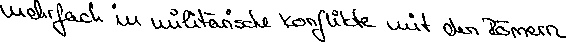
mehrfach in militärische Konflikte mit den Römern
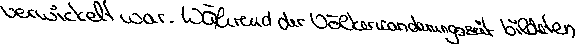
verwickelt war. Während der Völkerwanderungszeit bildeten
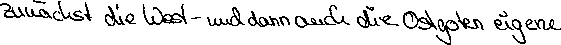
zunächst die West- und dann auch die Ostgoten eigene
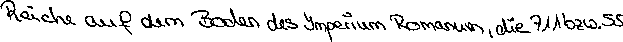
Reiche auf dem Boden des Imperium Romanum, die 711 bzw. 55
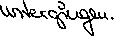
untergingen.
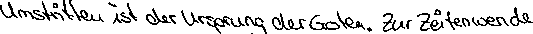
Umstritten ist der Ursprung der Goten. Zur Zeitenwende
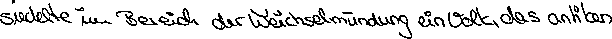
siedelte im Bereich der Weichselmündung ein Volk, das antiken
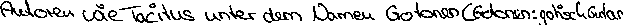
Autoren wie Tacitus unter dem Namen Gotonen (Gutonen; gotisch
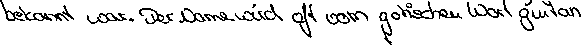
bekannt war. Der Name wird oft vom gotischen Wort giutan
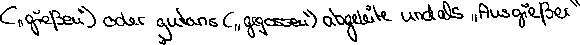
("gießen") oder gutans ("gegossen") abgeleitet und als "Ausgießer"
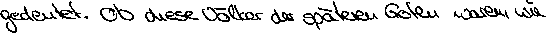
gedeutet. Ob diese Völker der späteren Goten waren, wie
